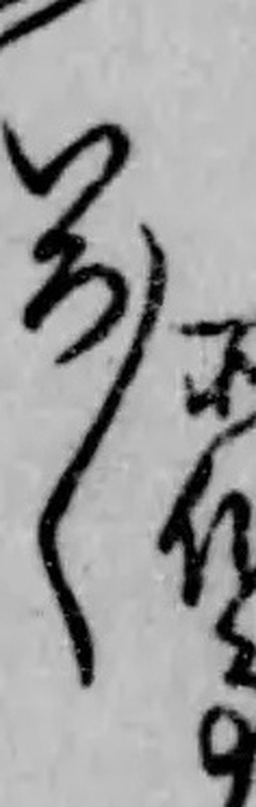いろ〳〵
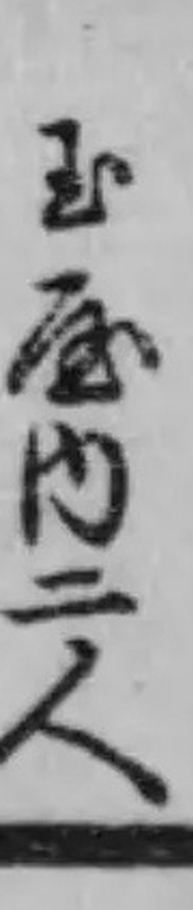玉屋内二人
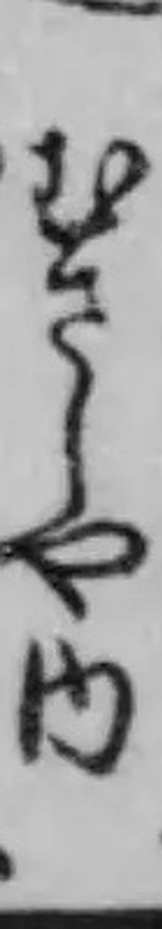むさしや内
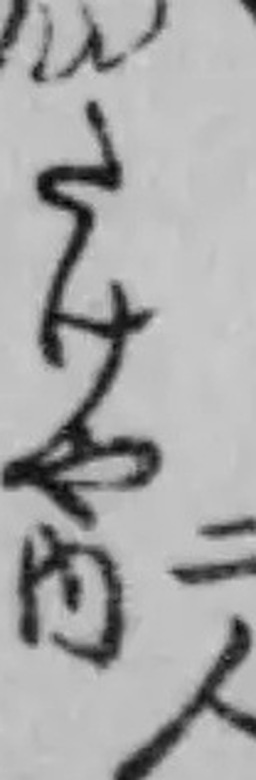たけや内

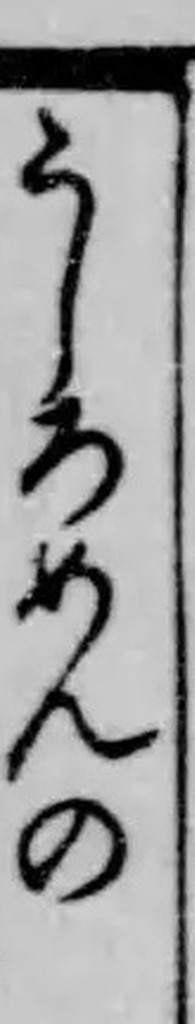うしろめんの
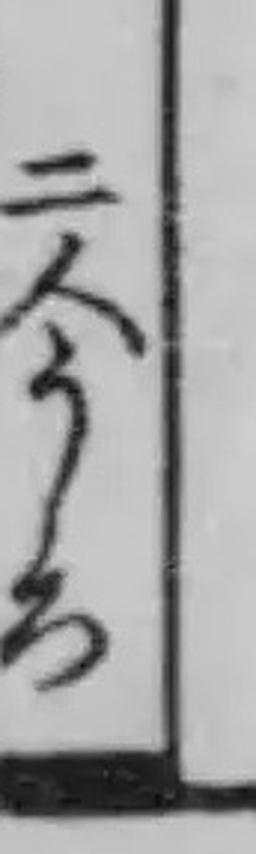二人うしろ
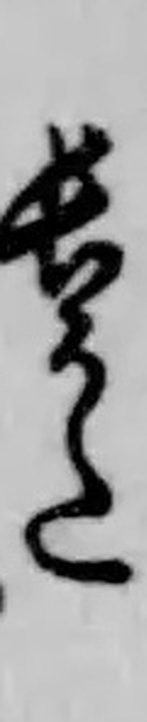長うた
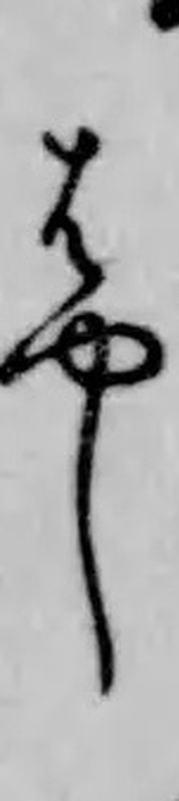はやし
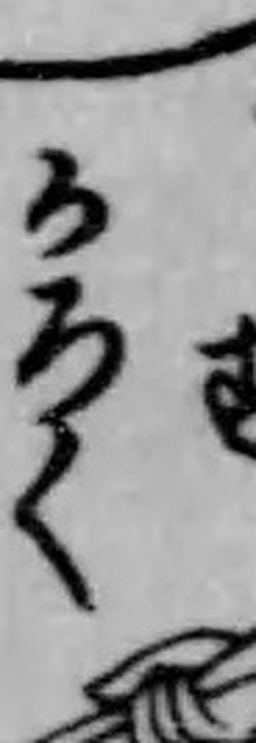かろく
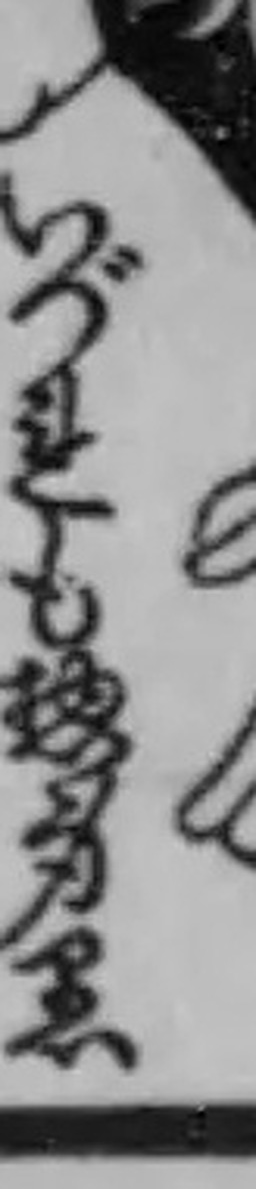いづれも惣身黒
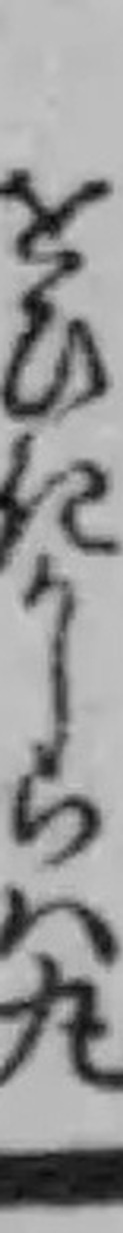をひきかしらは丸
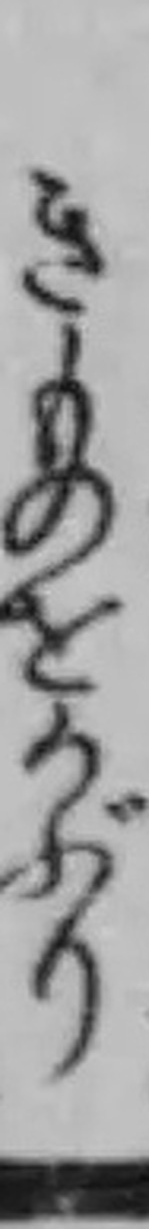きものをかぶり
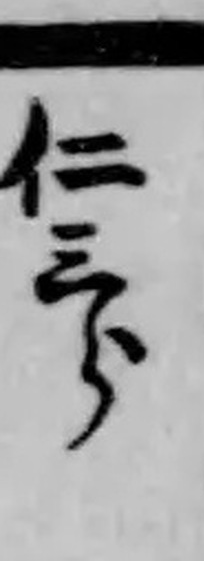仁三郎
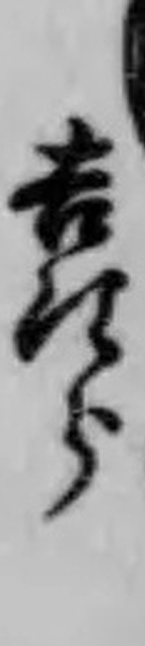吉次郎
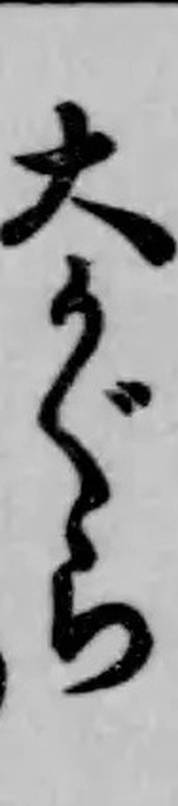大かぐら
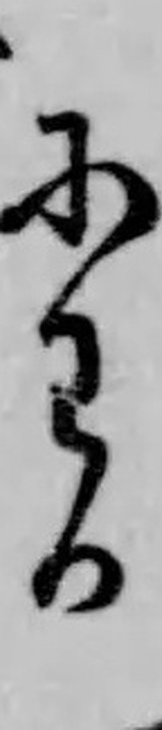にわは
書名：明月余情. 第1編
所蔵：国立国会図書館 National Diet Library, JAPAN
